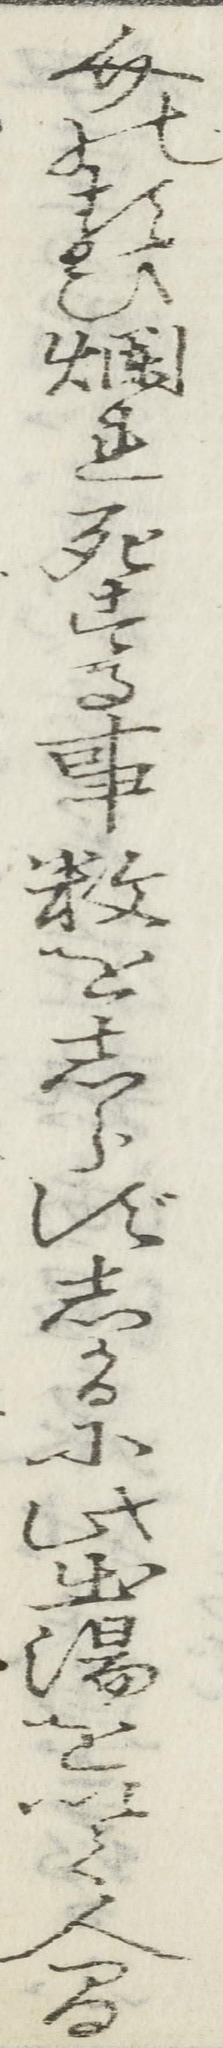介の類ひ爛れ死する事数をしらずしかるに此出湯を以て人間
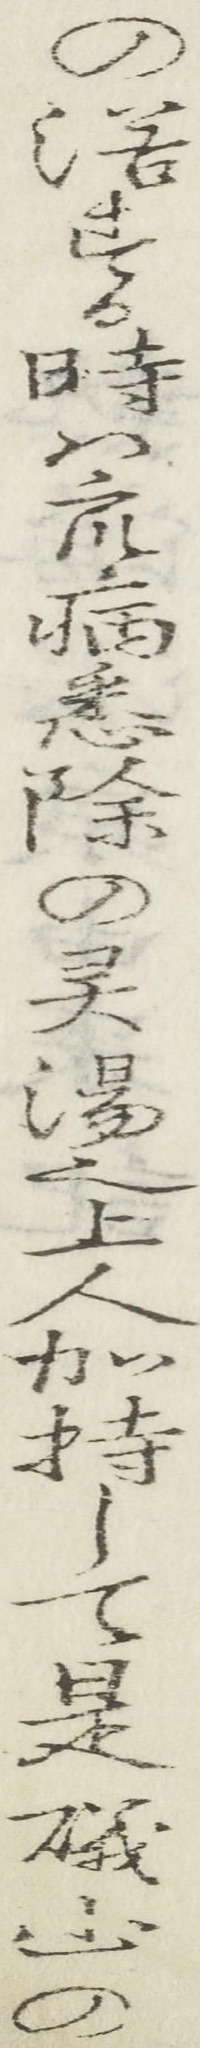の浴する時は衆病悉除の霊湯也上加持して是磯山の
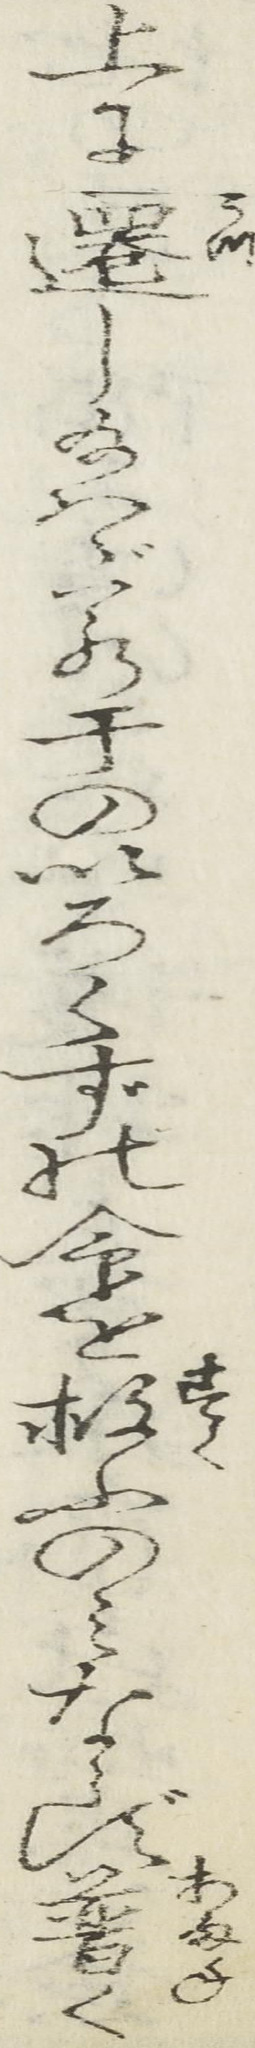上に遷し給はゞ若干のいろくずの命を救ふのみならず普く
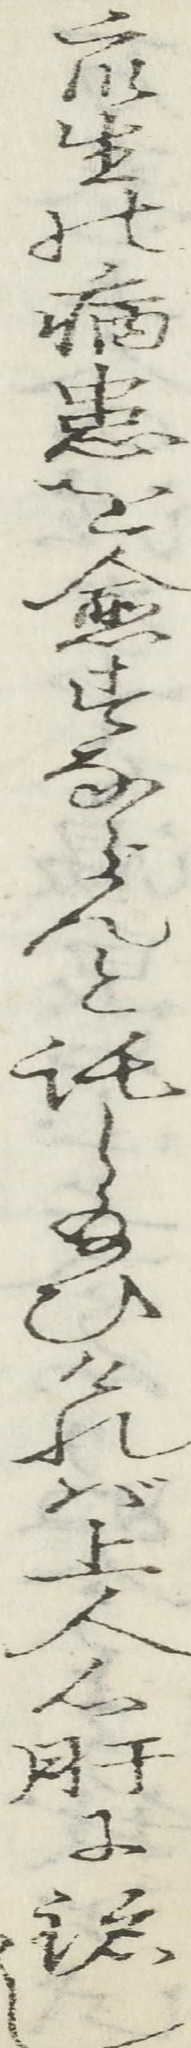衆生の病患を愈すならんと託し給ひければ上人心肝に銘し
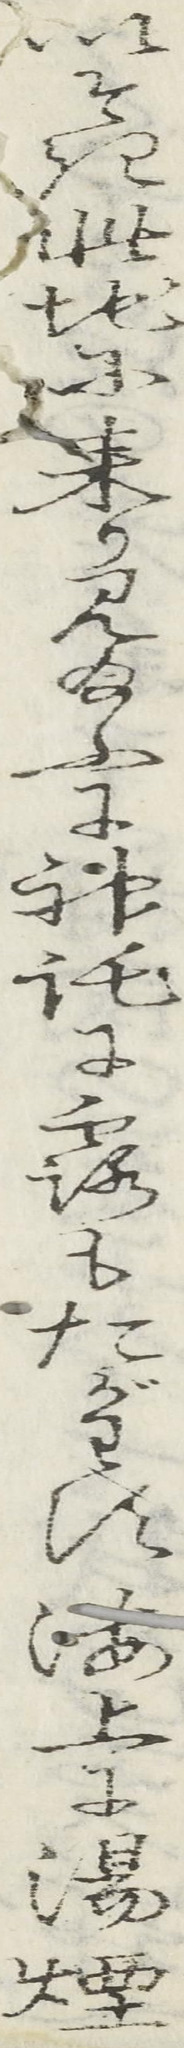いそぎ此地に来り見給ふに神託に露もたがわす海上に湯煙
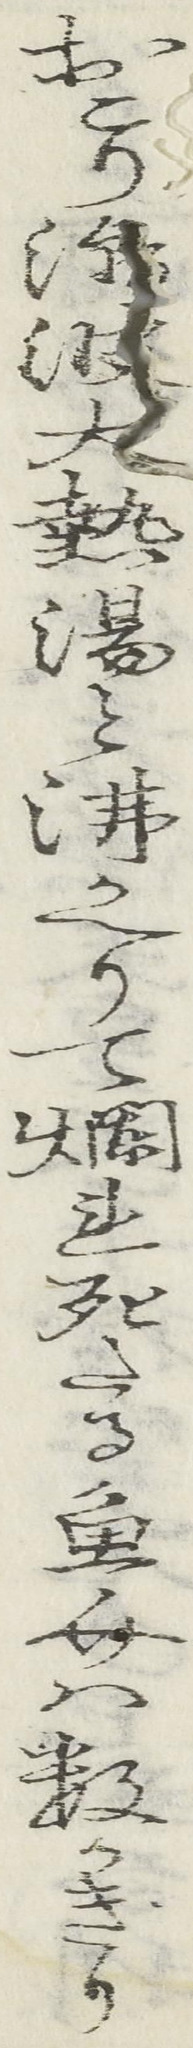おこり潮波大熱湯と沸かへりて爛れ死たる魚介は数かきり
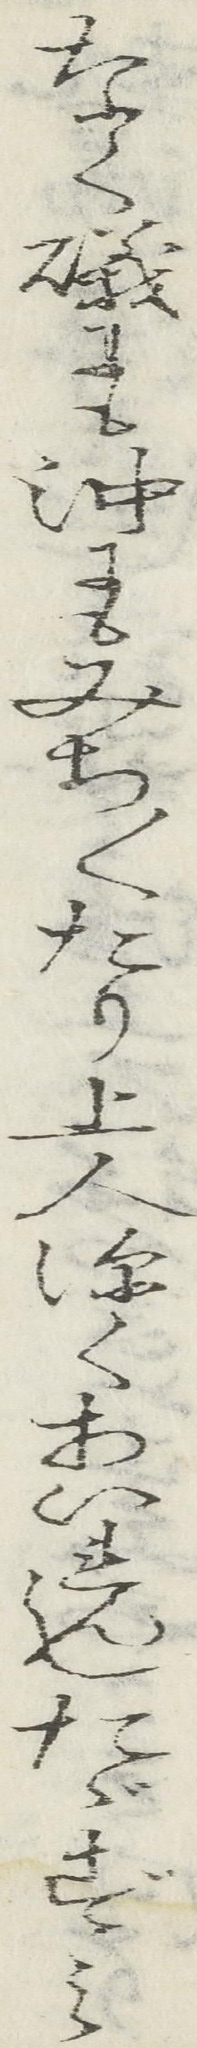なく磯にも沖にもみち〳〵たり上人深くあいれんしたゞずみ
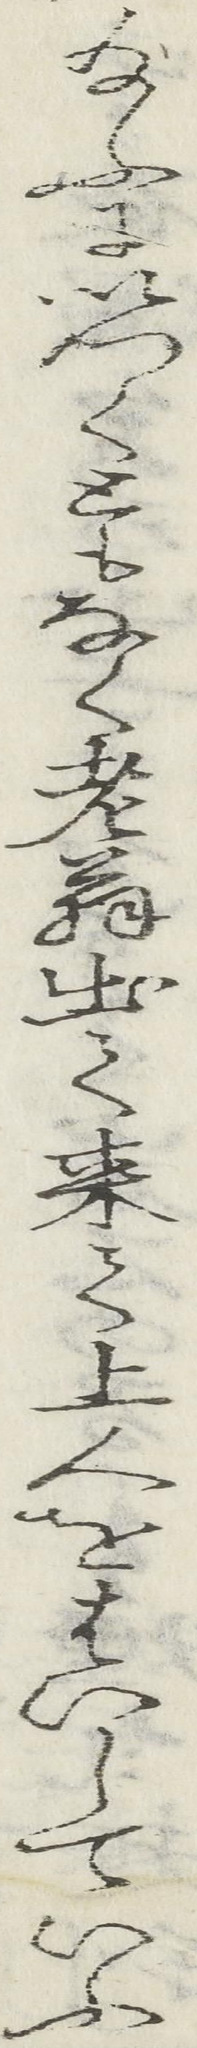給ふにいつくともなく老翁出て来て上人をはいしていふ
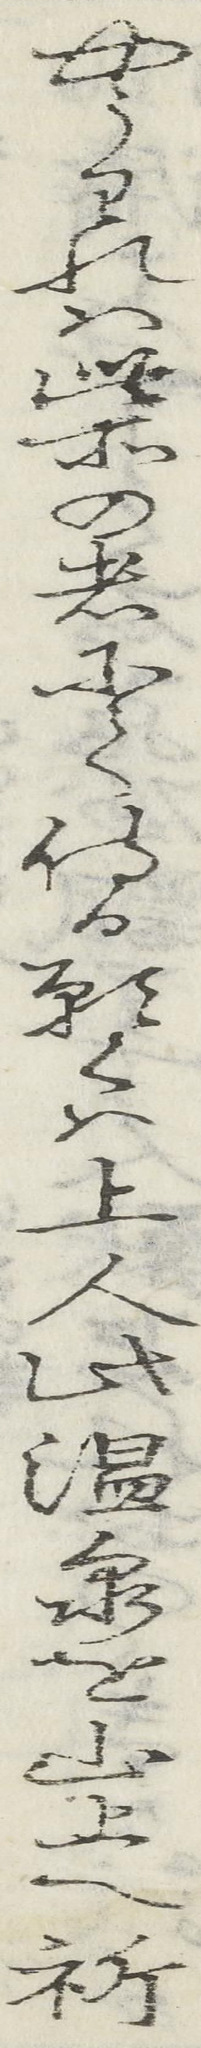やうわれは此所の者にて侍る願くは上人此温泉を山上へ祈
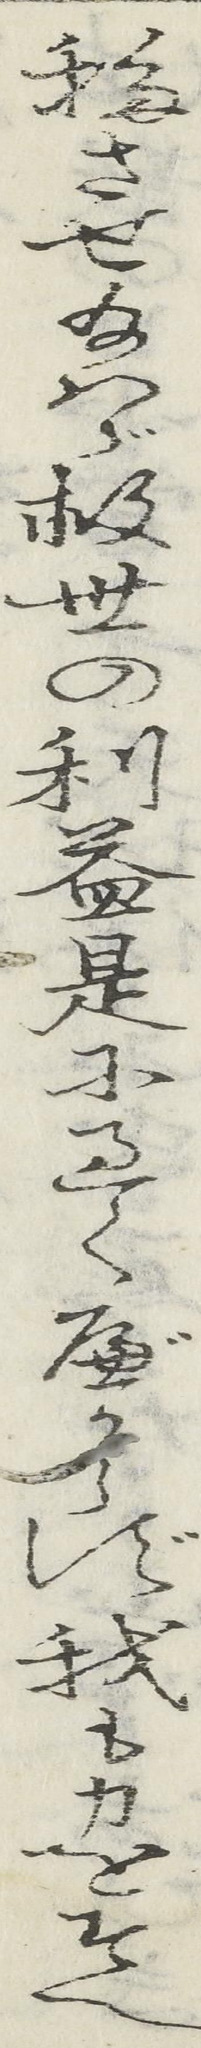移させ給はゞ救世の利益是に過くべからず我も力をそへ
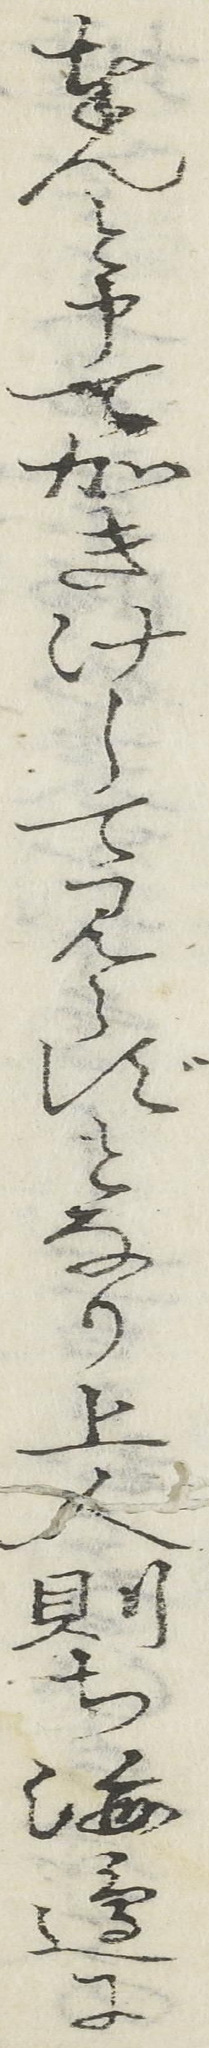奉んと申てかきけして見えずとなり上人則ち海辺に

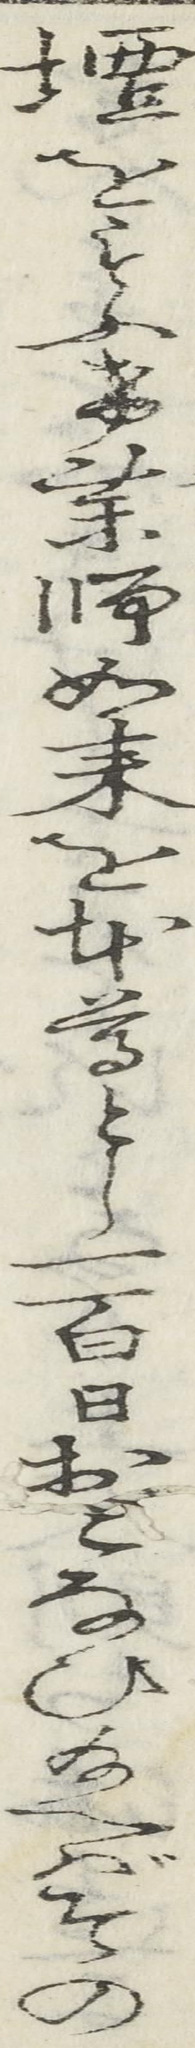壇をもふけ薬師如来を本尊とし一百日おこなひ給へばその
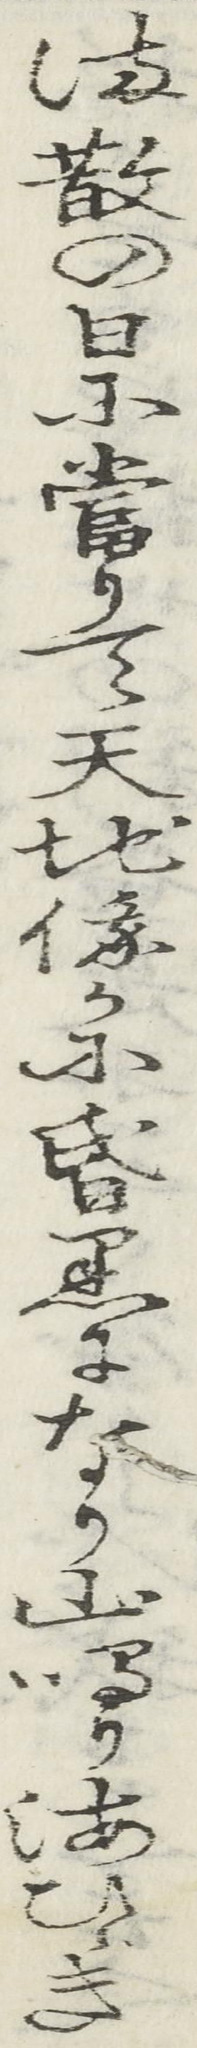満散の日に当りて天地俄かに昏暗になり山鳴り海ひゞき
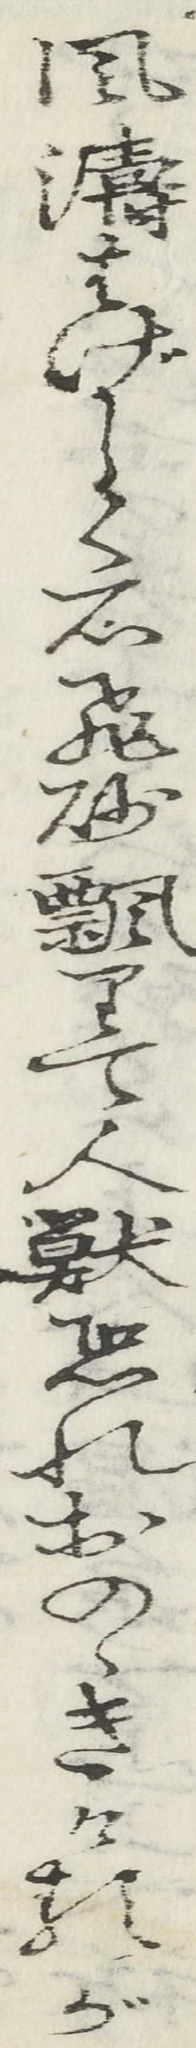風濤はげしく石飛砂飄りて人獣恐れおのゝきけるが
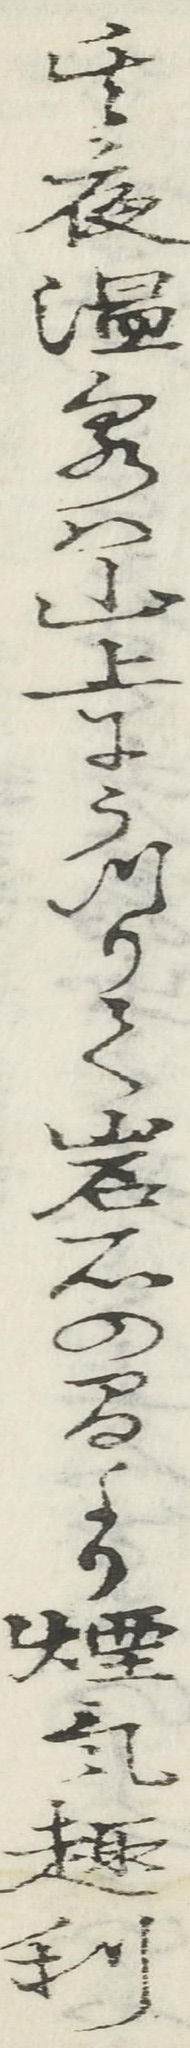其夜温泉は山上にうつりて岩石の間より煙気趣り
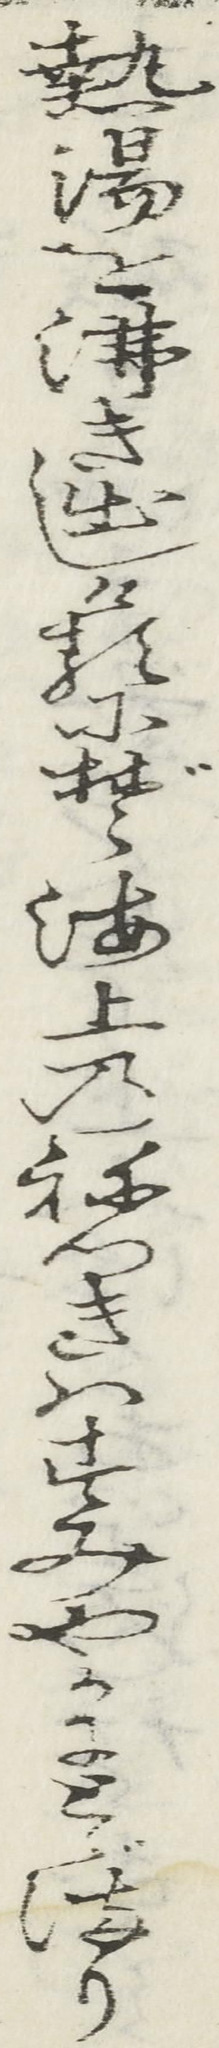熱湯を沸き出しけるにぞ海上のねつきはすみやかにとゞまり
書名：豆州熱海温泉由来記
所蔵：東京大学地震研究所図書室 Earthquake Research Institute Library, The University of Tokyo, JAPAN
